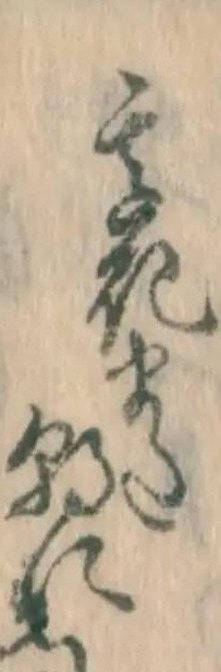其花また朝に開
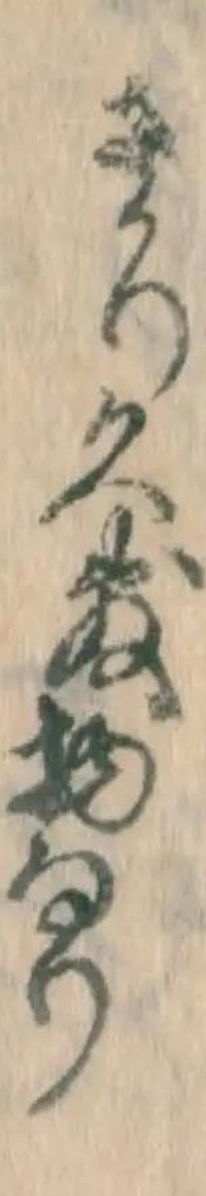さかり？久敷物なり
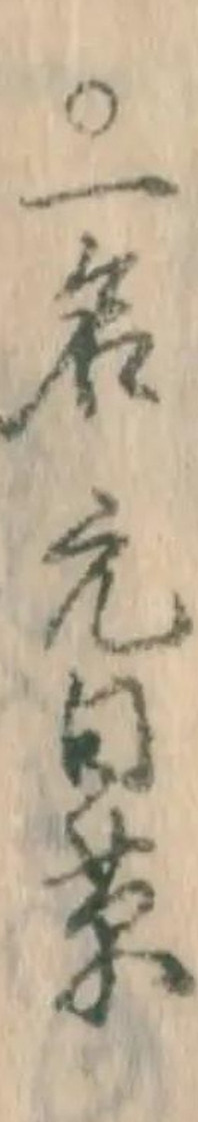〇一名元日草
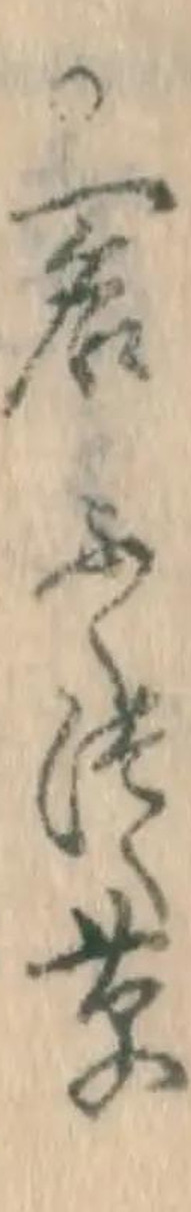〇一名ふくつく草
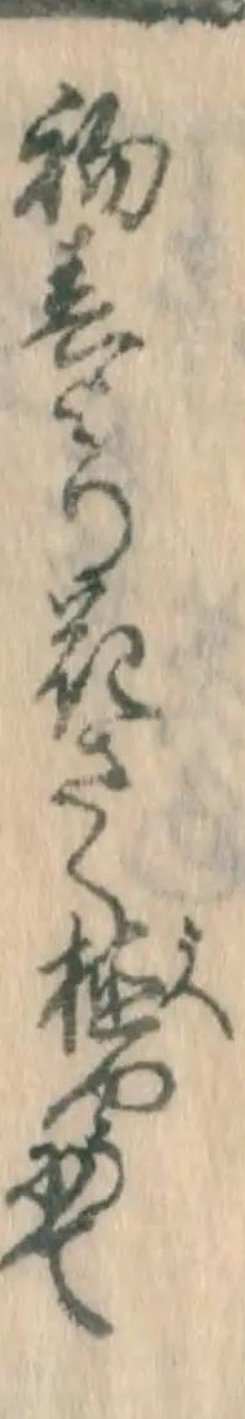初春より花さく植やうにて
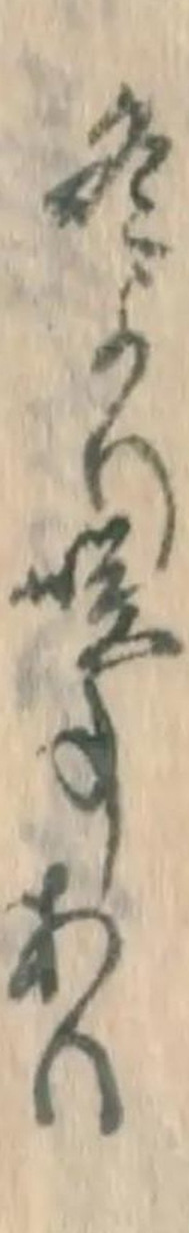冬より咲事あり

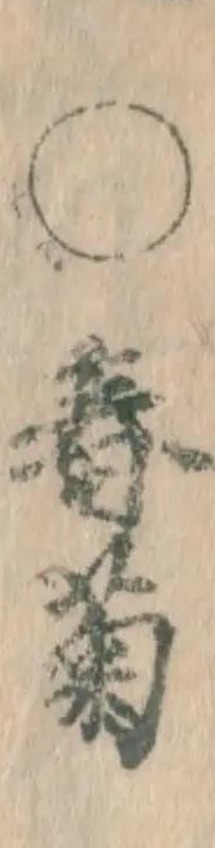〇春菊
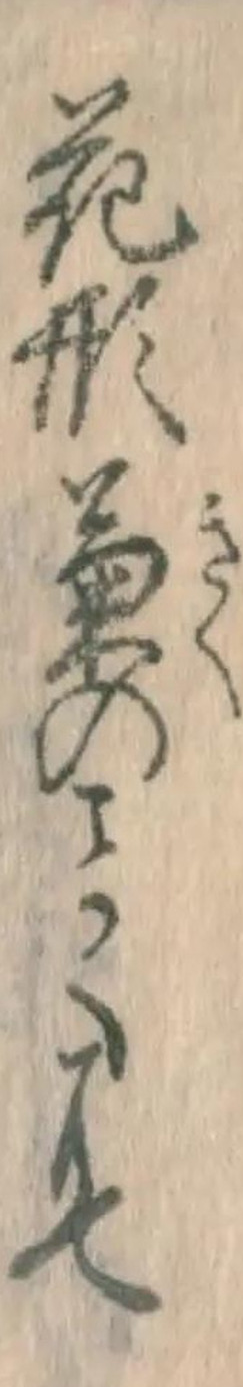花方菊のことくにて
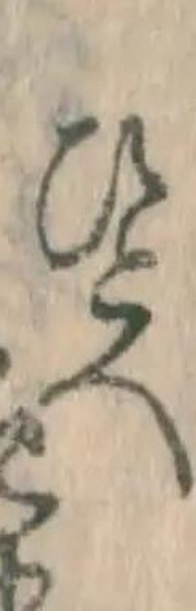ひとへ
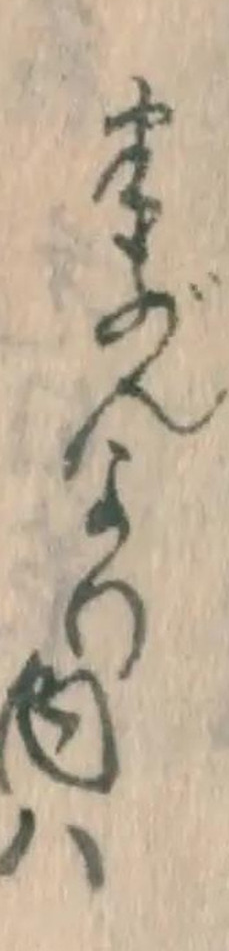半ぶんより内は
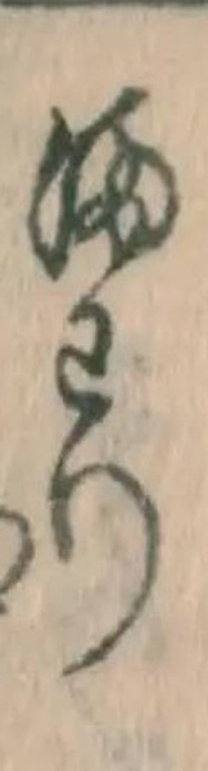まわり
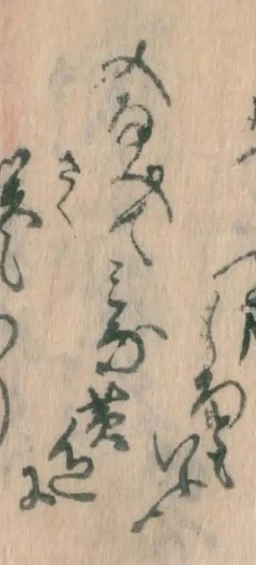又なべてみな黄色に
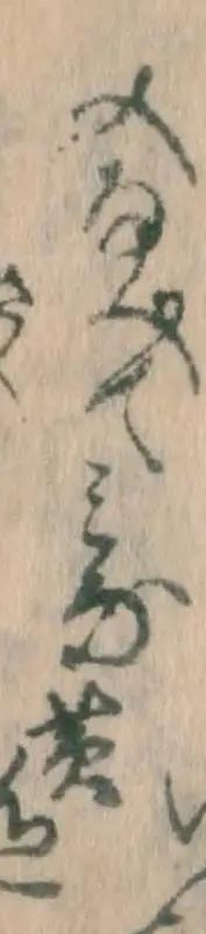又なべてみな黄色に
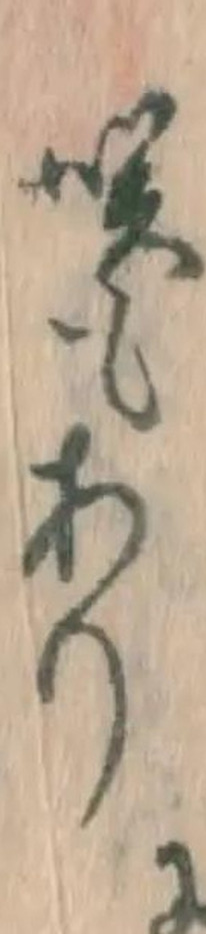咲もあり
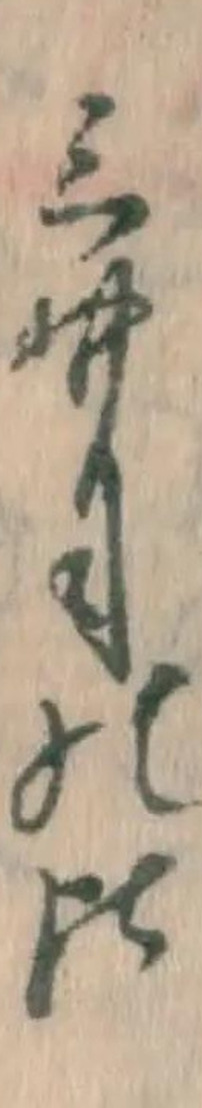三四月の比
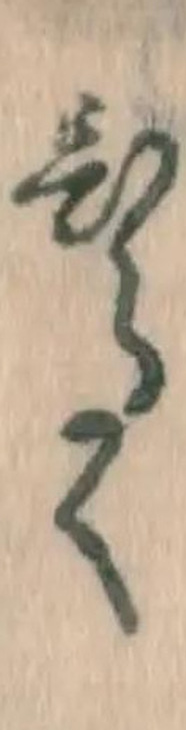ひらく
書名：艸花繪前集. [1]
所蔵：国立国会図書館 National Diet Library, JAPAN
